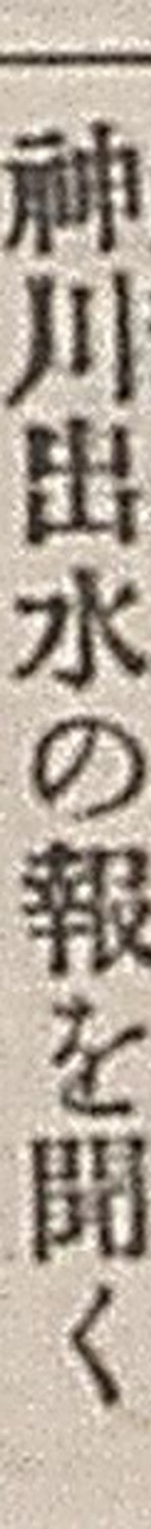神川出水の報聞く
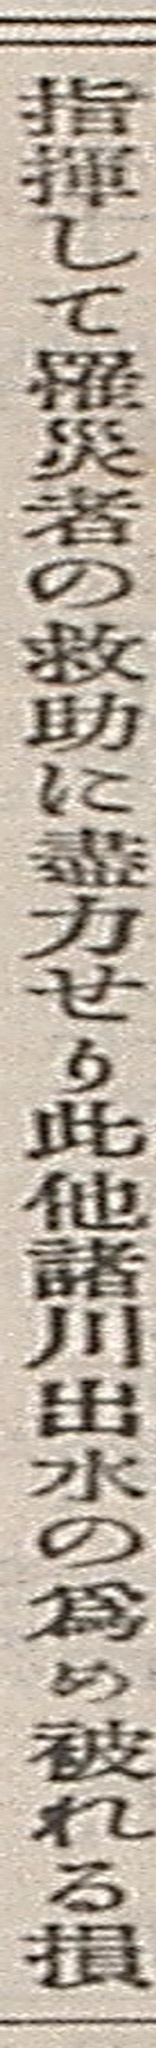指揮して罹災者の救助に尽力せり此他諸川出水の為め被れる損
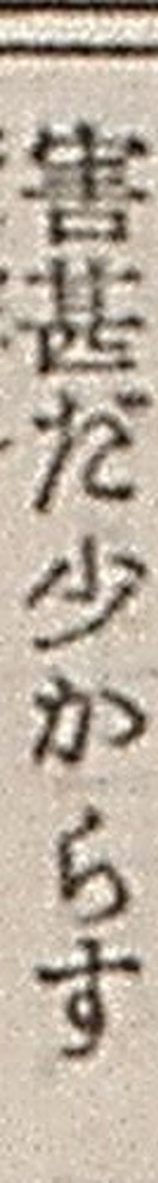害甚だ少からず
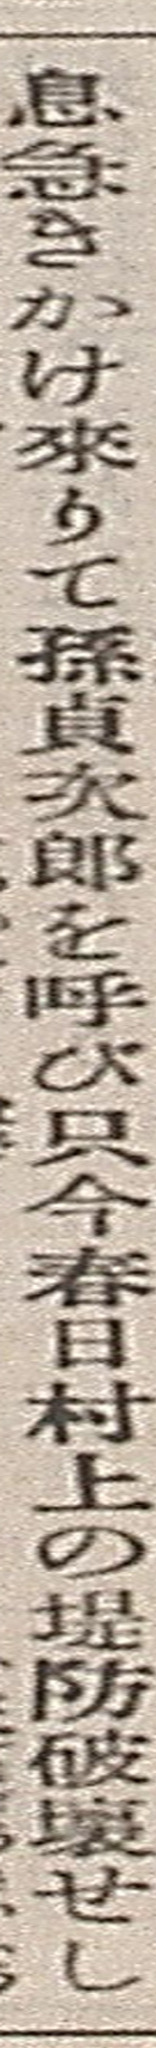息急きかけ来りて孫貞次郎を呼び只今春日村上の堤防破壊せし
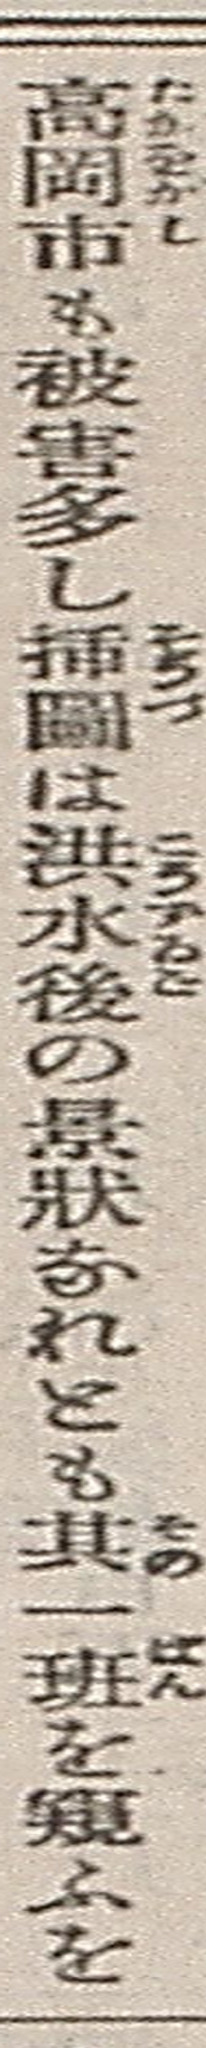高岡市も被害多し挿圖は洪水後の景状なれども其一班を窺ふを
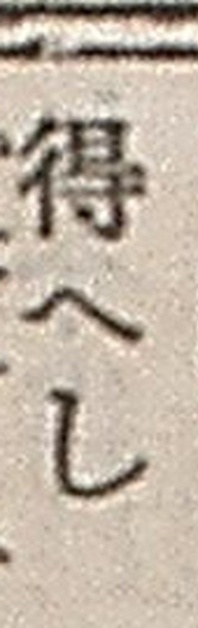得べし
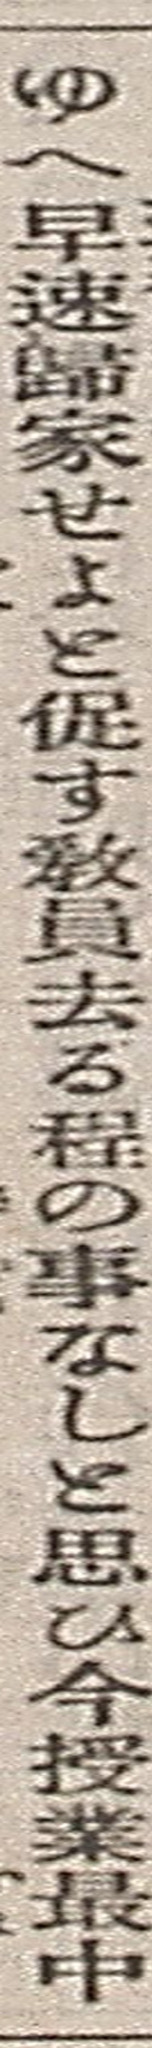ゆへ早速帰家せよと促す教員去る程の事なしと思ひ今授業最中
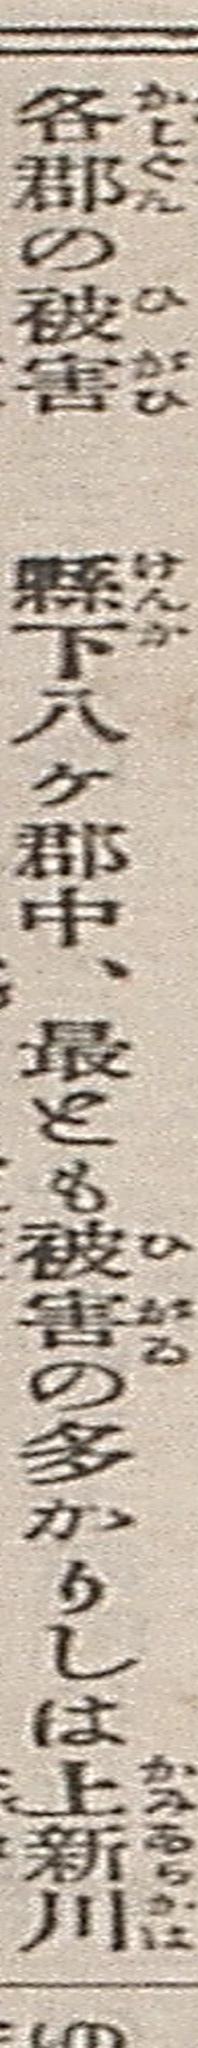各郡の被害県下八ヶ郡中、最とも被害の多かりしは上新川
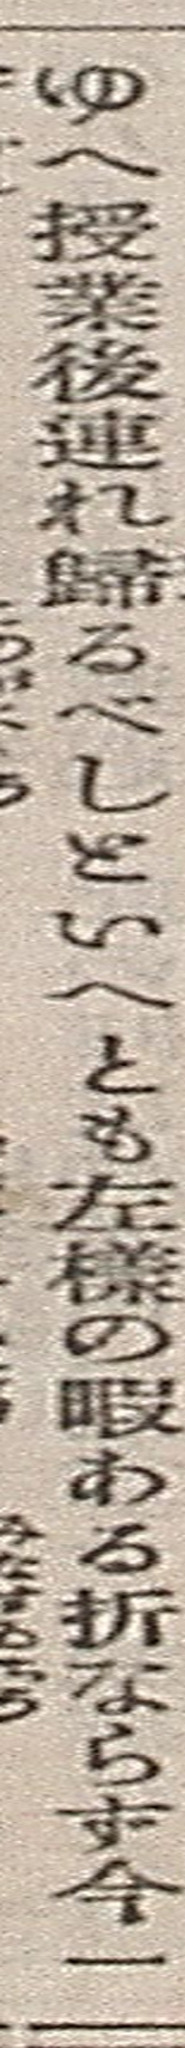ゆへ授業後連れ帰るべしといへとも左様の暇ある折ならず今一
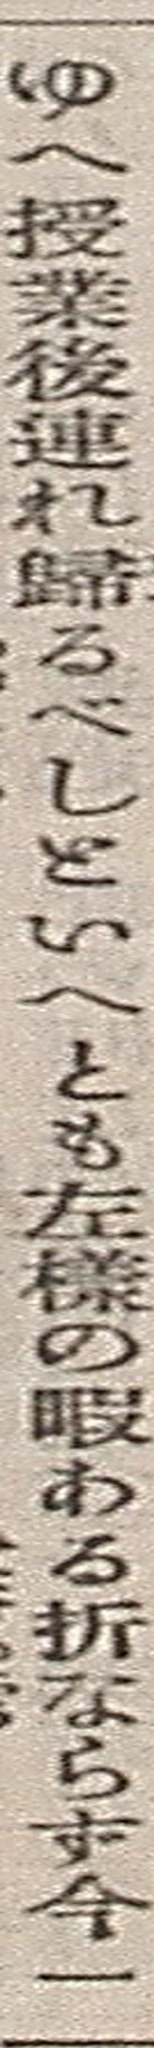ゆへ授業後連れ帰るべしといへとも左様の暇ある折ならず今一
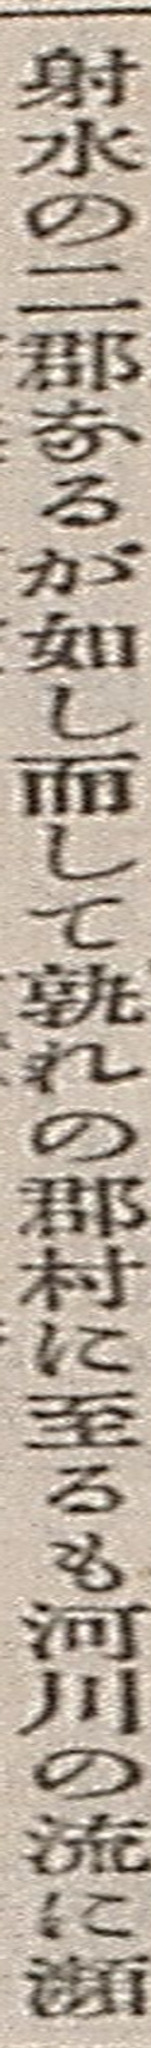射水の二郡なるが如し而して孰れの郡村に至るも河川の流に瀬
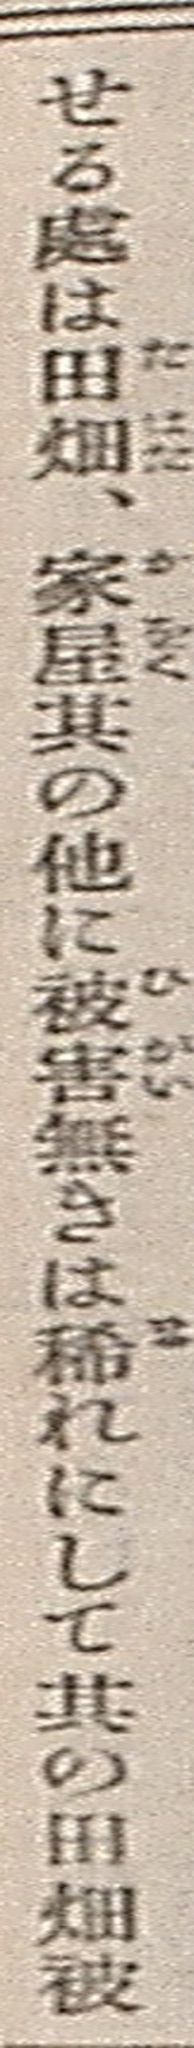せる処は田畑、家屋其の他に被害無きは稀れにして其の田畑被
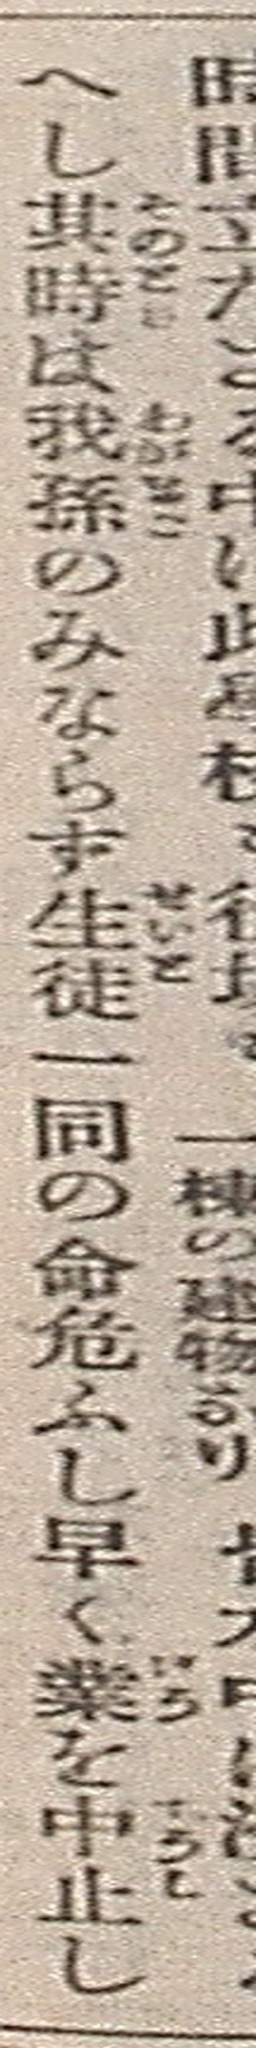へし其時は我孫のみならず生徒一同の命危ふし早く業を中止し

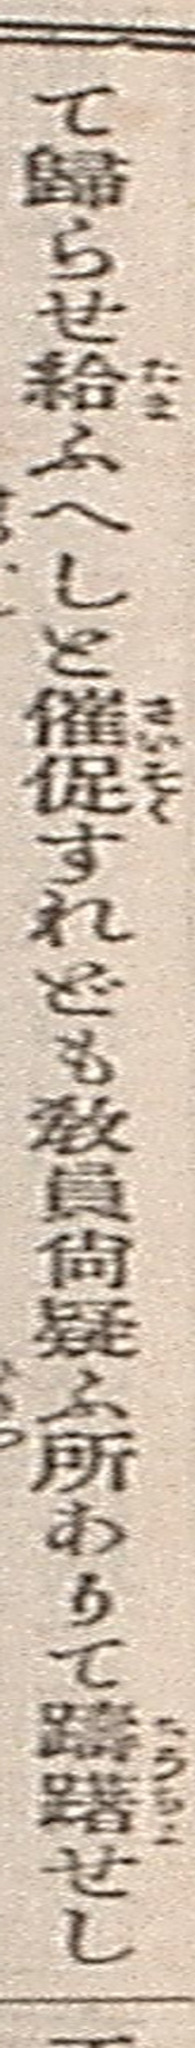て帰らせ給ふへしと催促すれども教員尚疑ふ所ありて躊躇せし
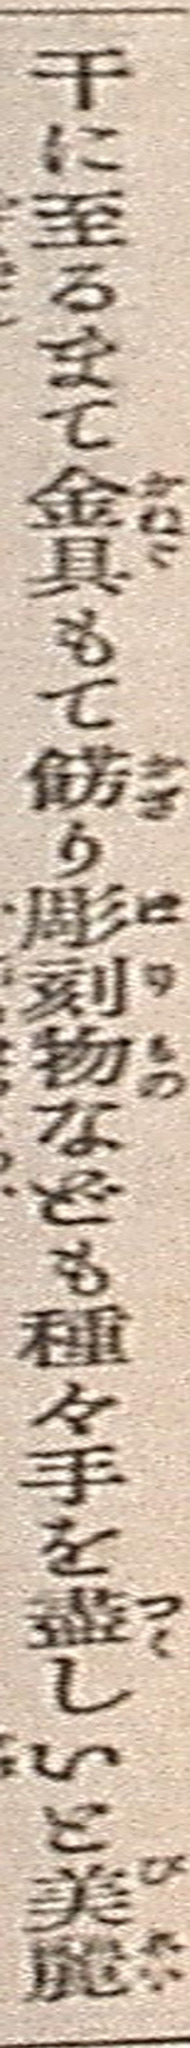干に至るまで金具もて飾り彫刻物なども種々手を盡しいと美麗
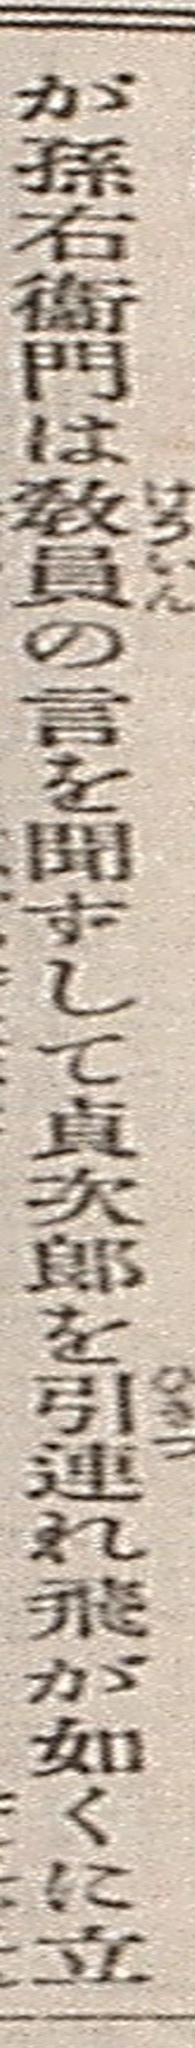が孫右衛門は教員の言を聞ずして貞次郎を引連れ飛が如くみ立
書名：風俗畫報臨時増刊第百二十八號　洪水被害録（下）
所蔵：東京大学地震研究所図書室 Earthquake Research Institute Library, The University of Tokyo, JAPAN
